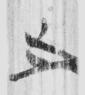之
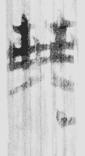典
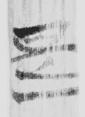是
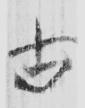古
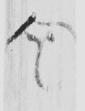它
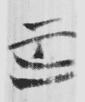正
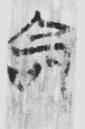命
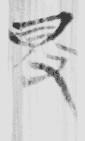𠭁
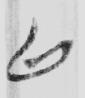㠯（以）
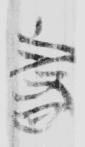時
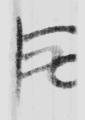厇
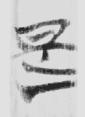是
